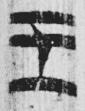王
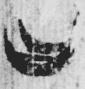曰
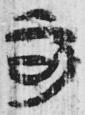可
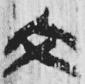文
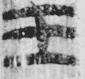王
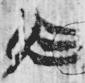於
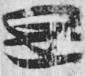是
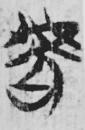唬（乎）
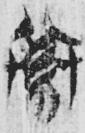素
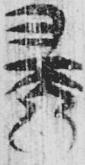耑（端）
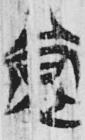裳
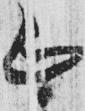㠯（以）
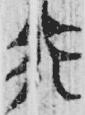行
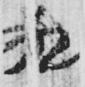九
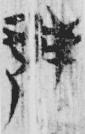邦
